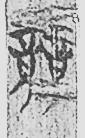競
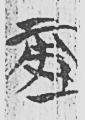坪
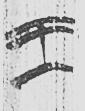王
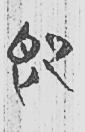即
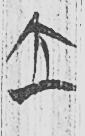立
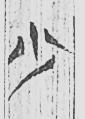少
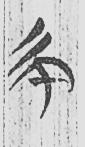帀
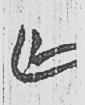亡
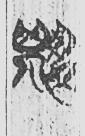{其丮}
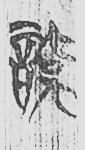{言䖵口}
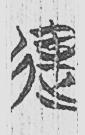連
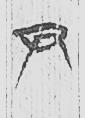尹
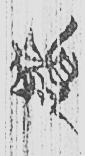{者頁}
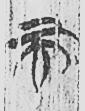而
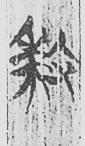殺
